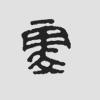{雨走}
